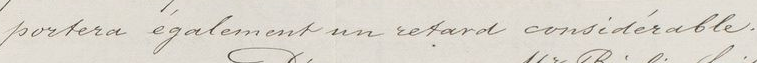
portera également un retard considérable.
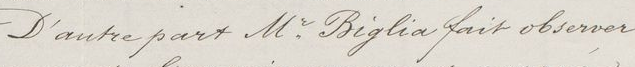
D'autre part MrBiglia fait observer
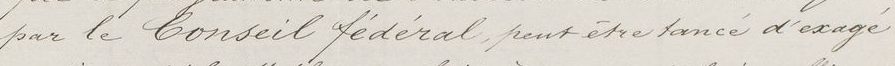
par le Conseil Fédéral, peut être lancé d'exagé-
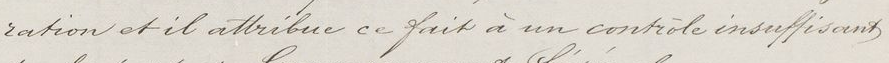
ration et il attribue ce fait à un contrôle insuffisant
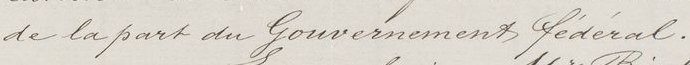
de la part du Gouvernement Fédéral.
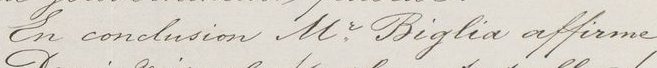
En conclusion MrBiglia affirme
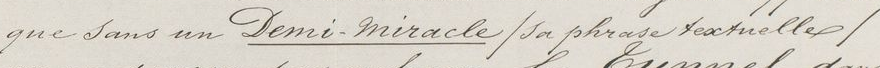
que sans un Demi-Miracle (sa phrase textuelle)
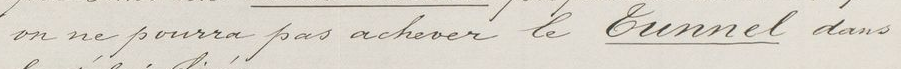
on ne pourra pas achever le Tunnel dans
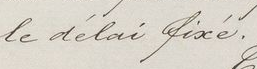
le délai fixé.
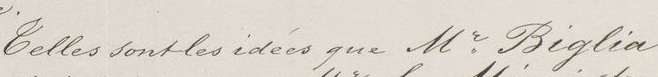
Telles sont les idées que MrBiglia
